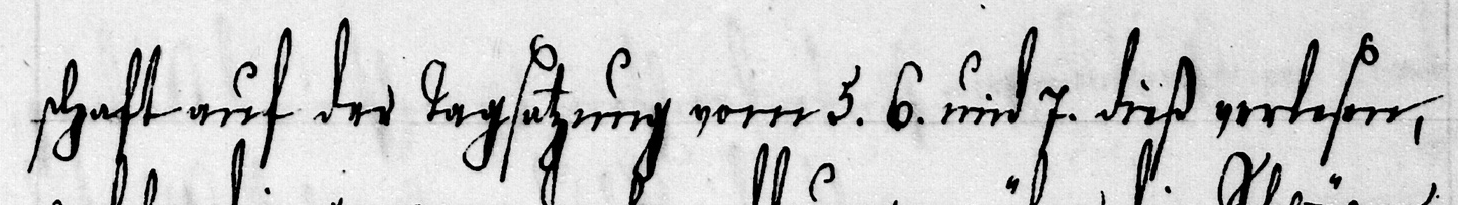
schaft auf der Tagsatzung vom 5. 6. und 7. dieß verlesen,
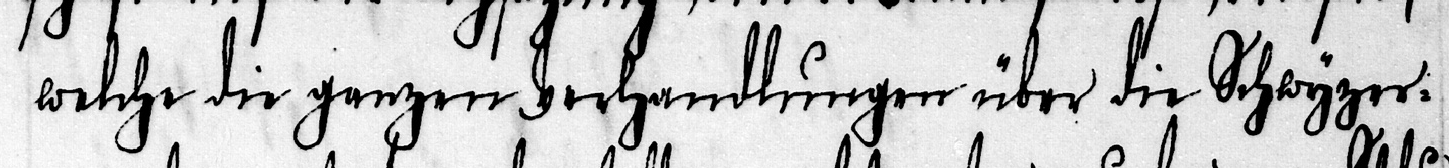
welche die ganzen Verhandlungen über die Schwyzer¬
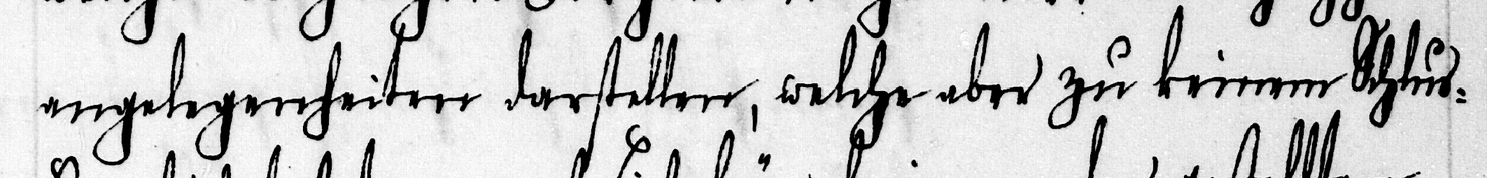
angelegenheiten darstellen, welche aber zu keinem Schluß¬
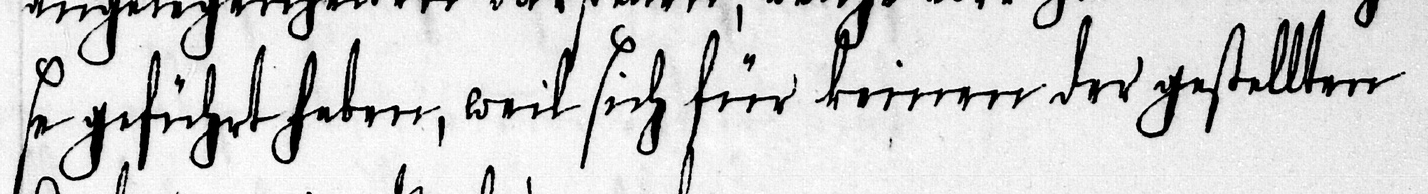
e geführt haben, weil sich für keinen der gestellten
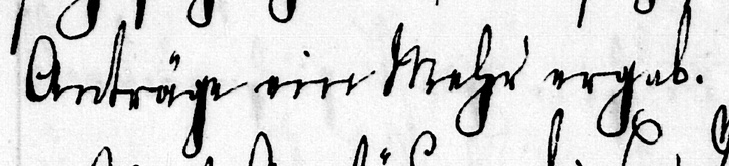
Anträge ein Mehr ergab.
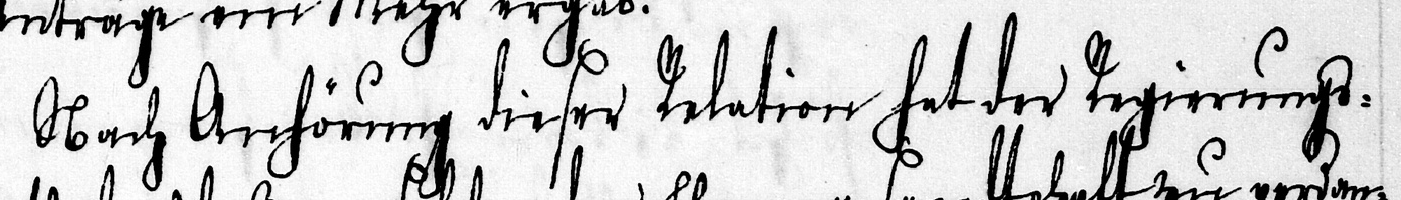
Nach Anhörung dieser Relation hat der Regierungs¬
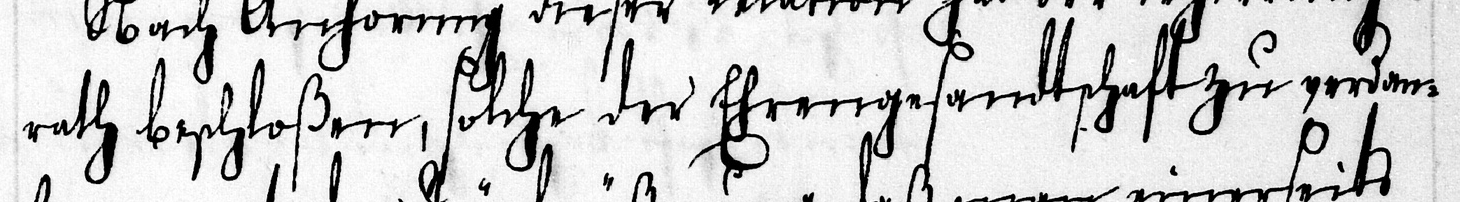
rath beschloßen, solche der Ehrengesandtschaft zu verdan¬
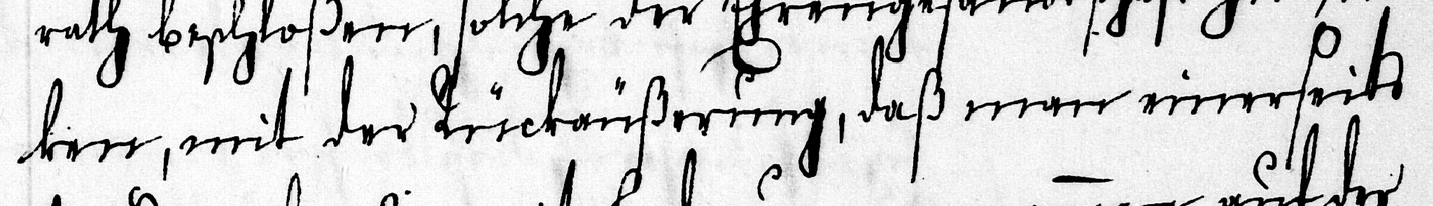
ken, mit der Rückäußerung, daß man einerseits
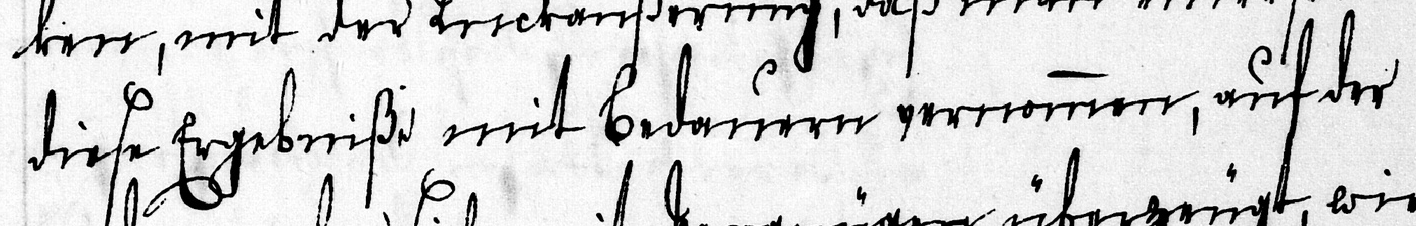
diese Ergebniße mit Bedauern vernommen, auf der
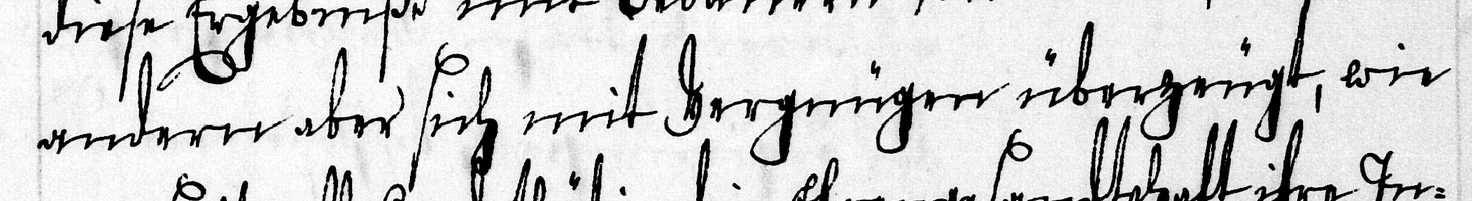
andern aber sich mit Vergnügen überzeugt, wie
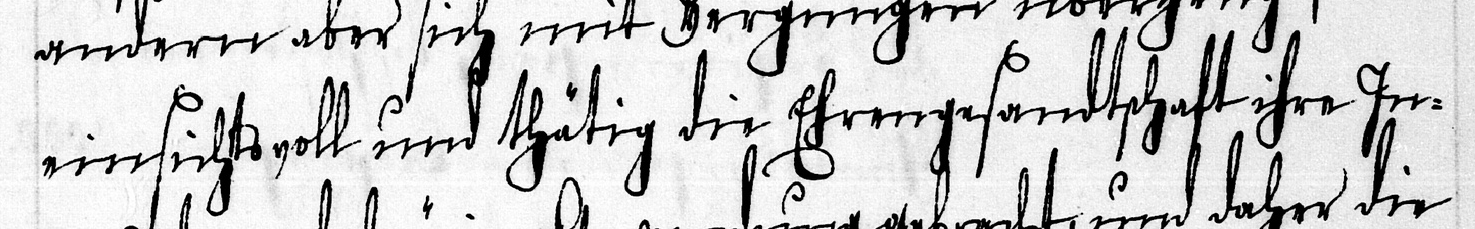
einsichtsvoll und thätig die Ehrengesandtschaft ihre In¬
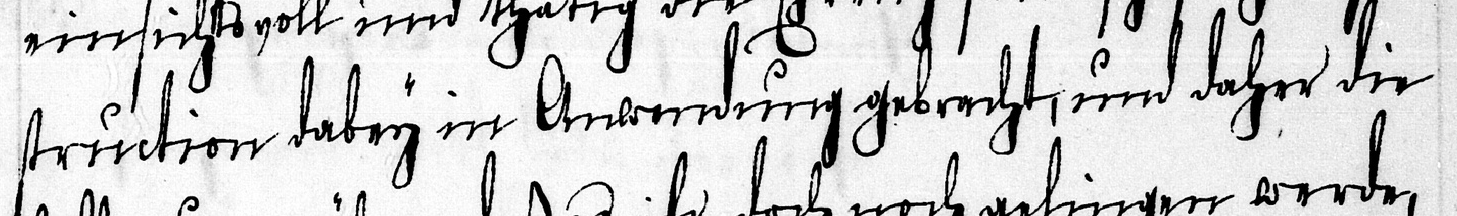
struction dabey in Anwendung gebracht, und daher die
